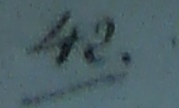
42.
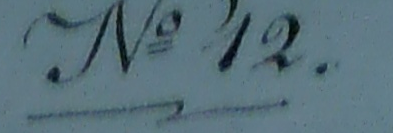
No͇ 12.
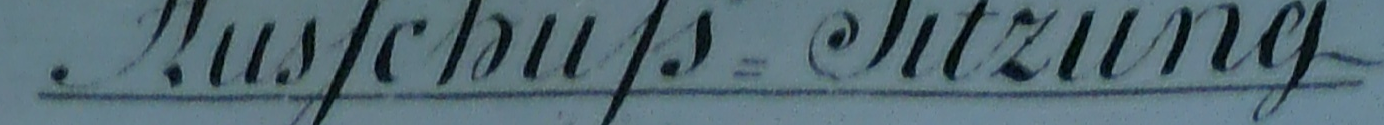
Ausschuss‗Sitzung
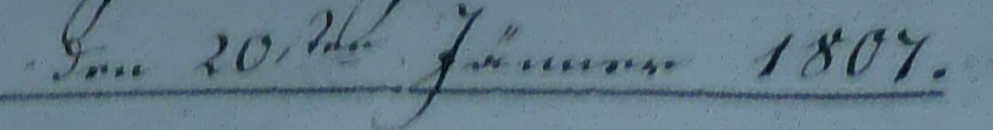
den 20sten͇ Jänner 1807.
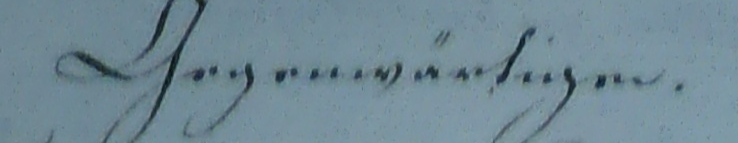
Gegenwärtige.
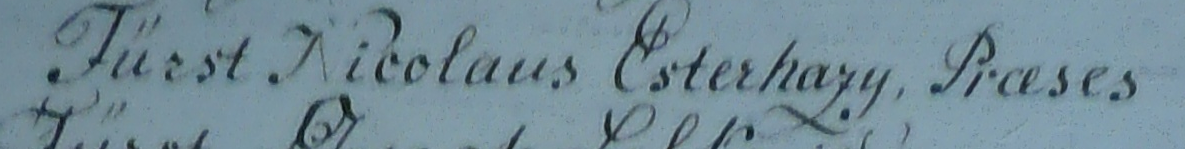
Fürst Nicolaus Esterhàzy, Præses
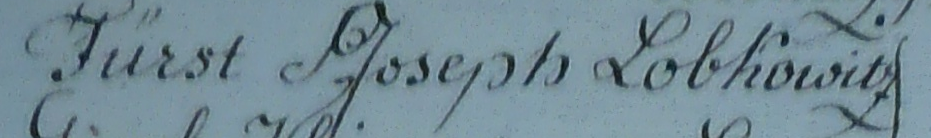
Fürst Joseph Lobkowitz
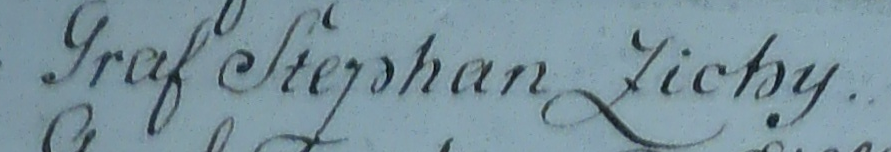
Graf Stephan Zichy.
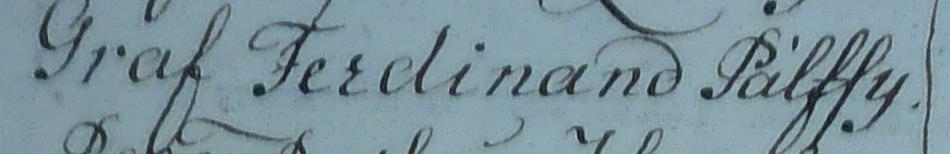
Graf Ferdinand Pàlffy.
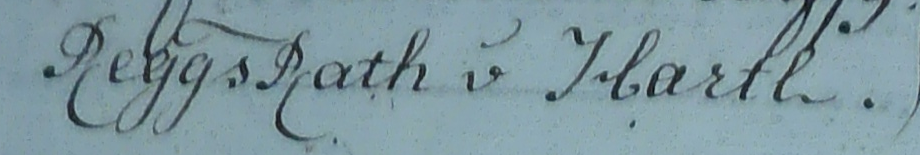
Reg͞gsRath v Hartl.
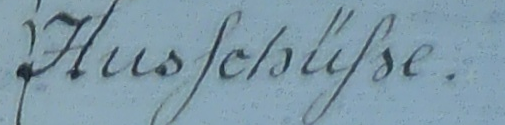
Ausschüsse
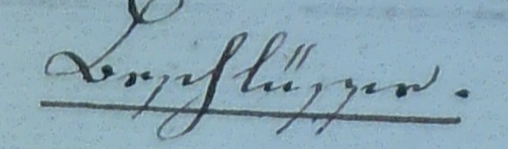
Beschlüsse.
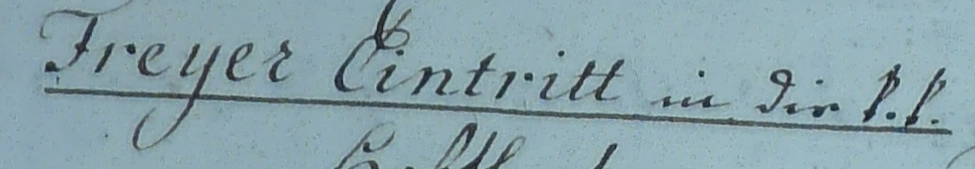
Freyer Eintritt in die k.k.
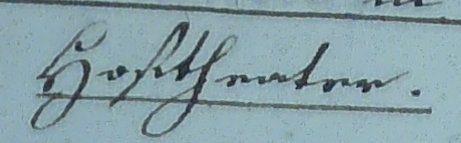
Hoftheater.
